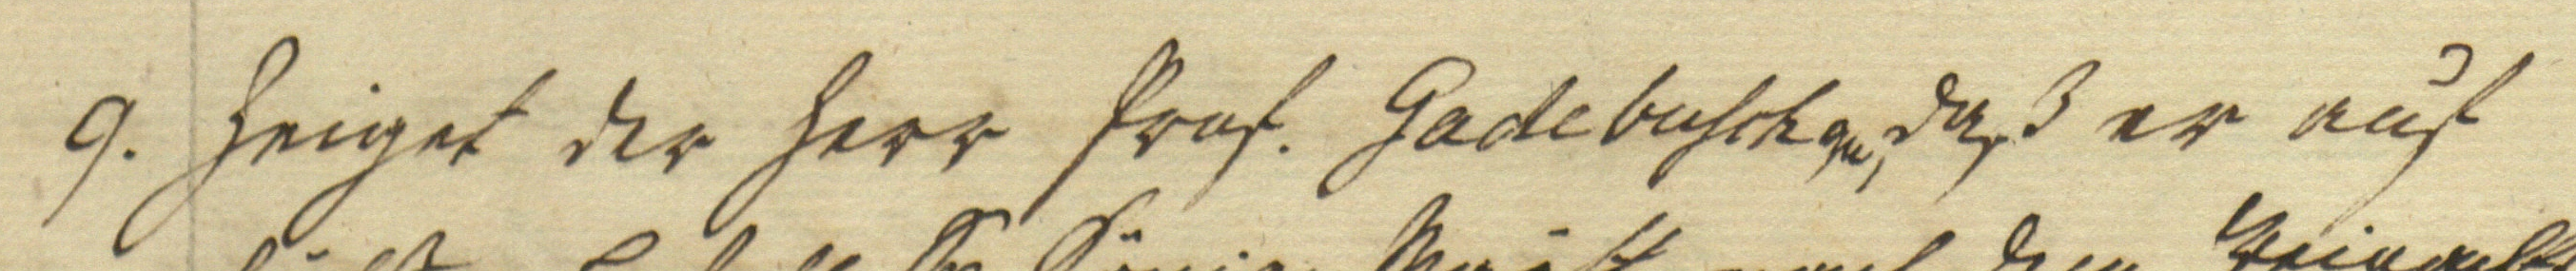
9. Zeiget der Herr Prof. Gadebusch an, daß er auf
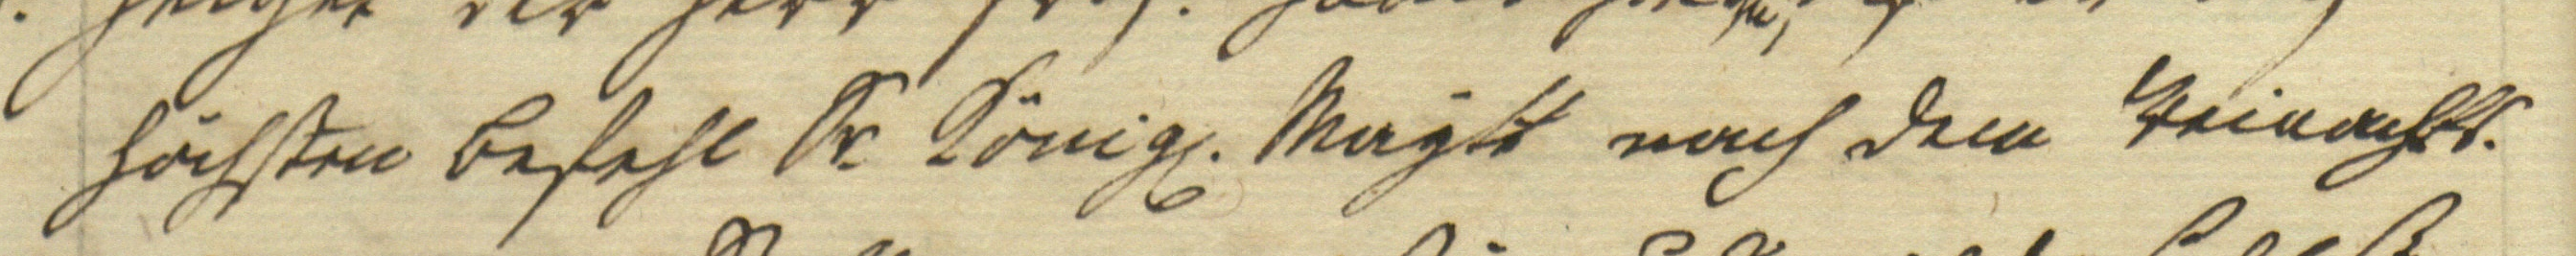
höchsten Befehl Sr Königl. Maÿtt. nach dem Weinachts¬
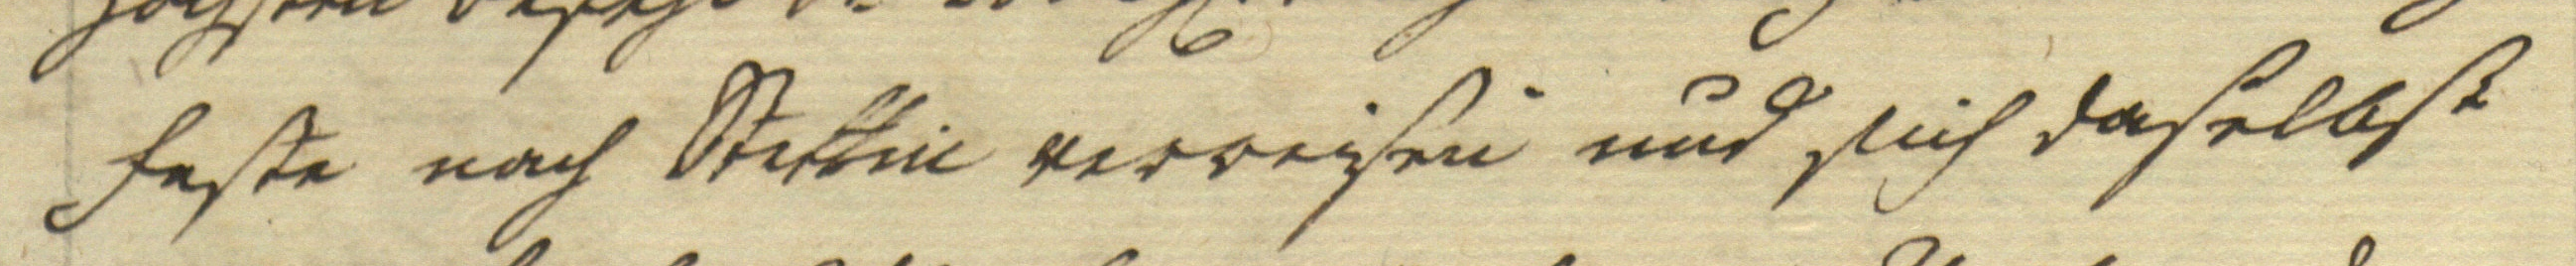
feste nach Stettin verreisen und sich daselbst
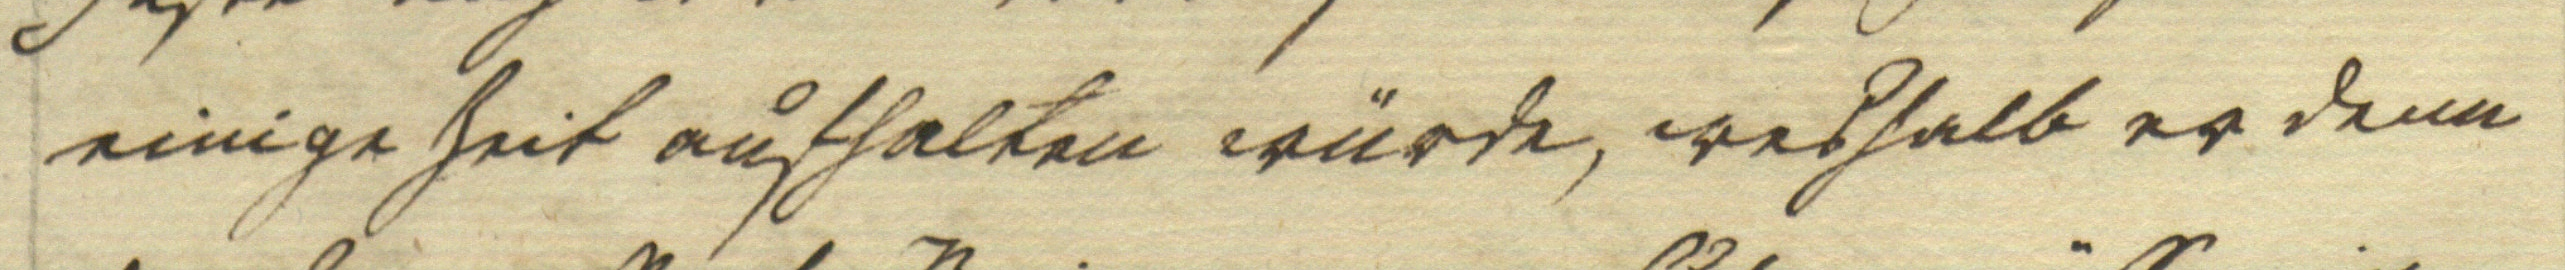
einige Zeit aufhalten würde, weshalb er denn
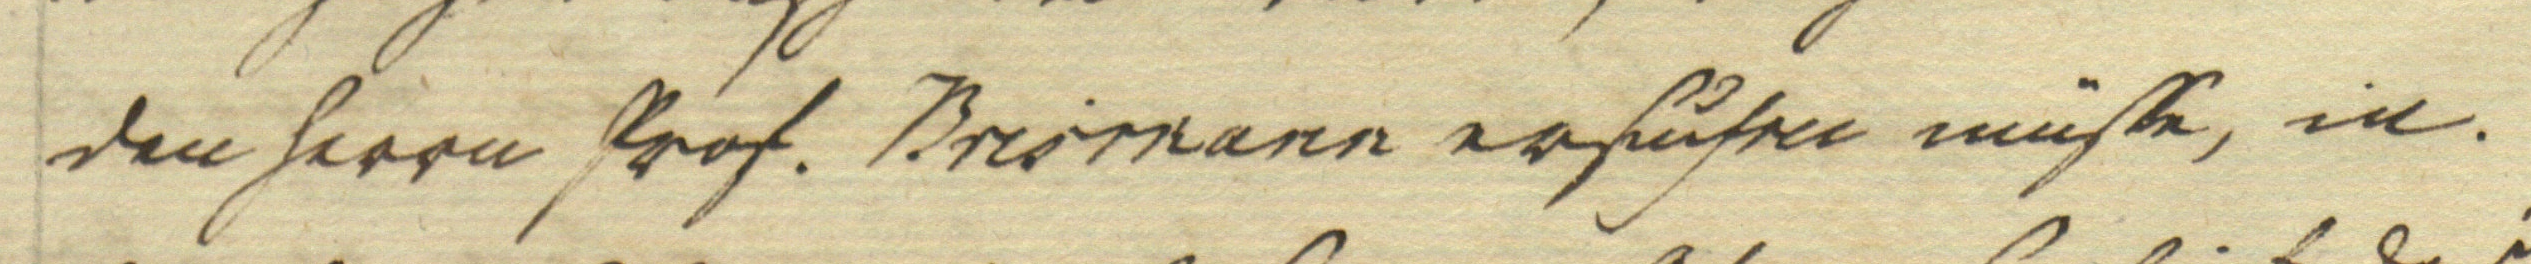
den Herrn Prof. Brismann ersuchen müsse, in¬
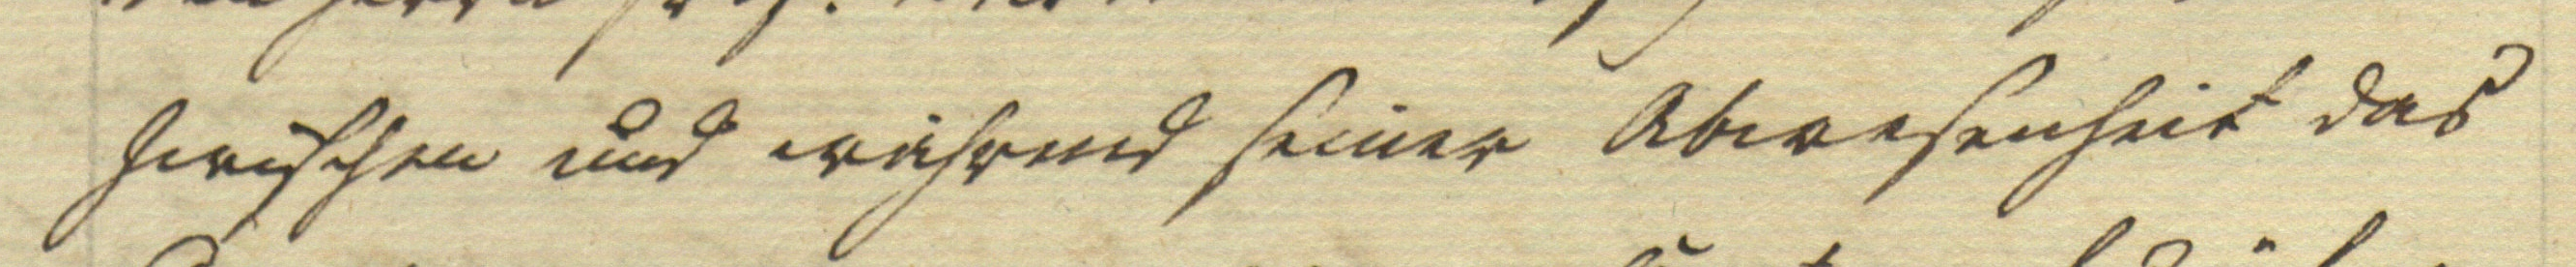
zwischen und während seiner Abwesenheit das
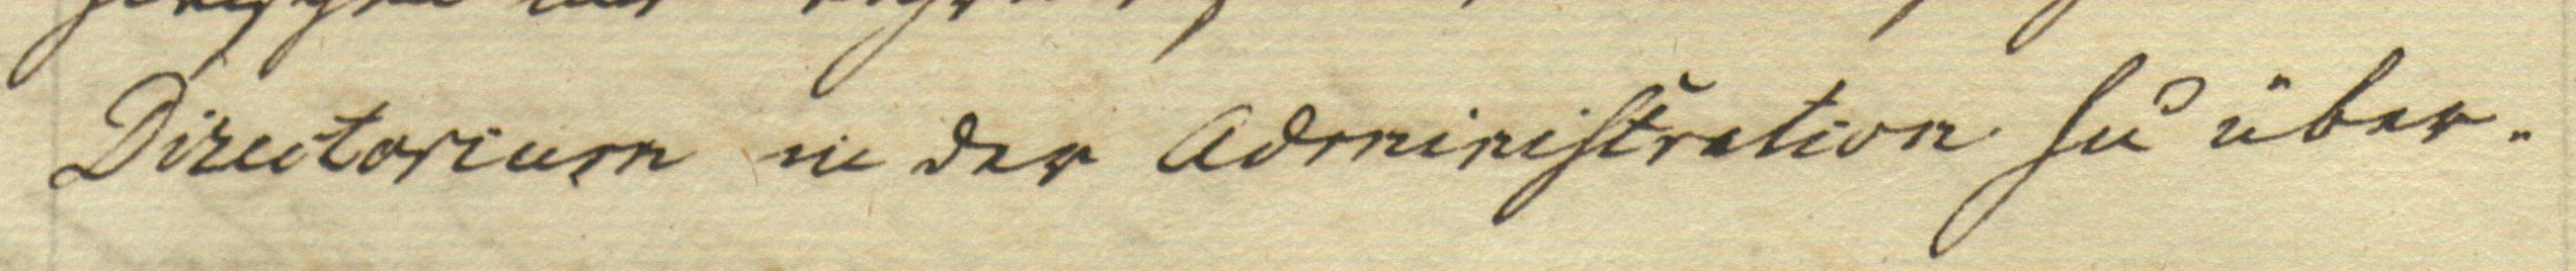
Directorium in der Administration zu über¬
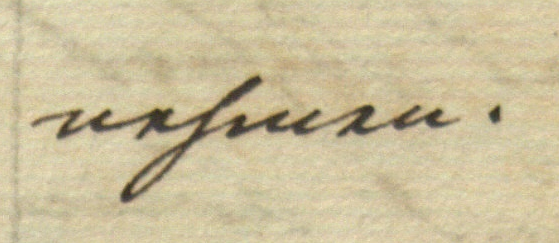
nehmen.
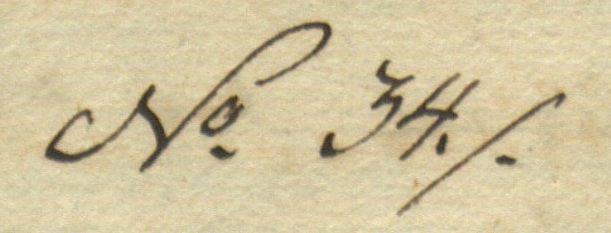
No. 34.
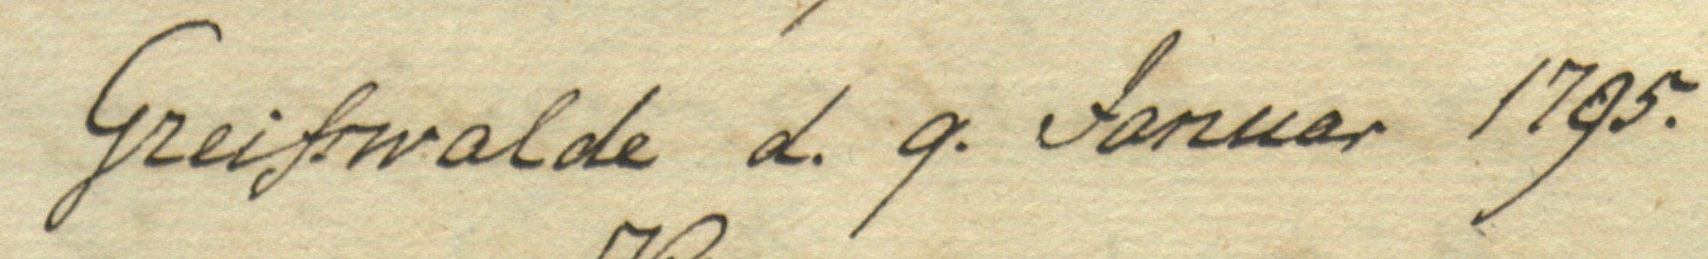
Greifswalde d. 9. Januar 1795.
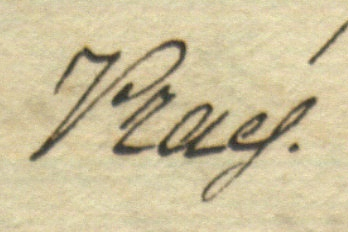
Praes.
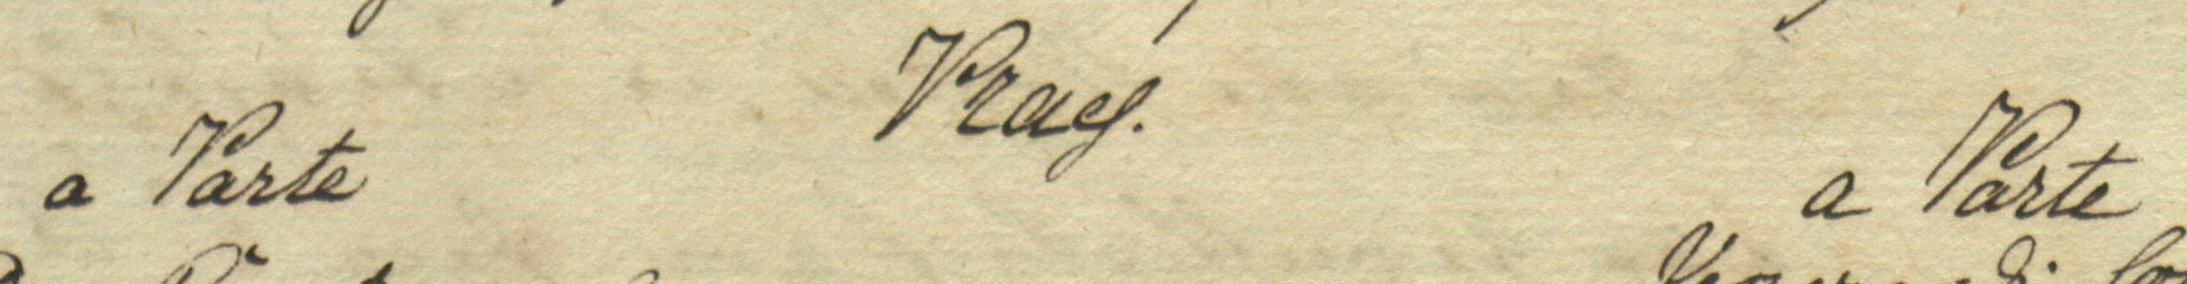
a Parte a Parte
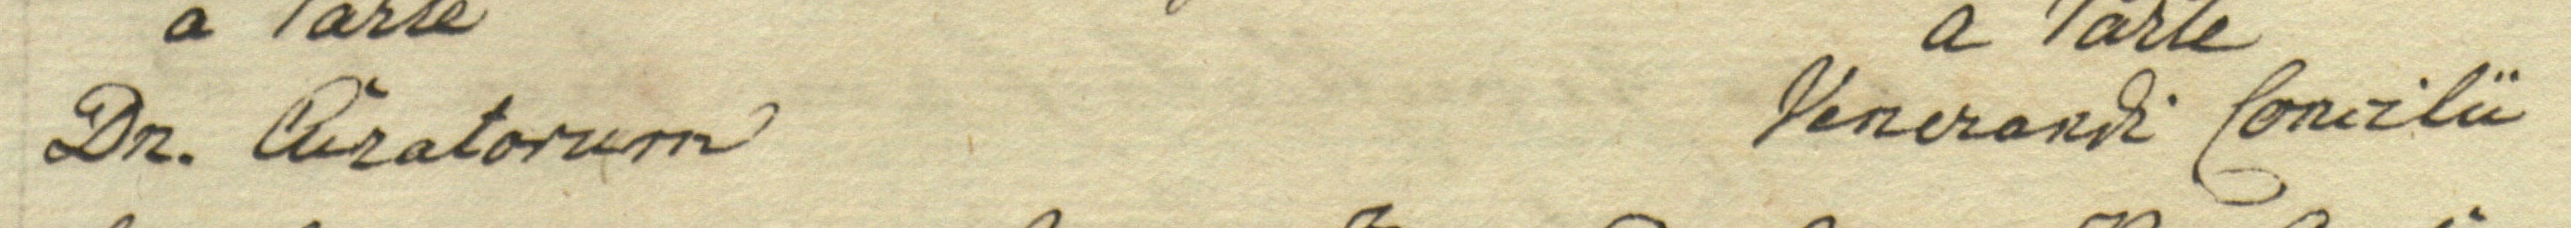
Dn. Curatorum Venerandi Concilii
